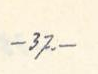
37
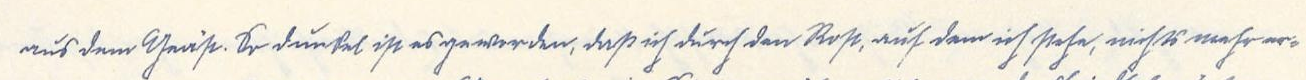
aus dem Geäst. So dunkel ist es geworden, daß sich durch den Rost, auf dem ich stehe, nichts mehr er-
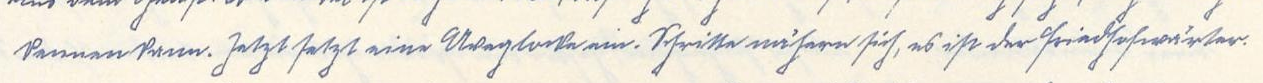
kennen kann. Jetzt setzt eine Glocke ein. Schritte nähern sich. Es ist der Friedhofswärter.
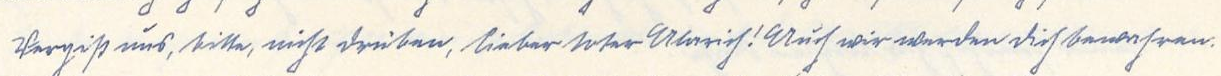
Vergiß uns bitte nicht drüben, lieber toter Alarich! Auch wir werden dich bewahren.
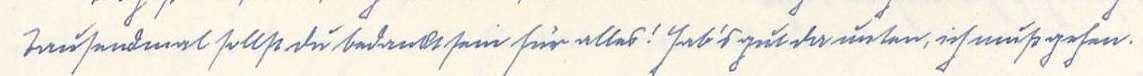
Tausendmal sollst du bedankt sein für alles! Hab’s gut da unten!, ich muß gehen.
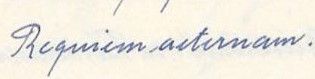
Requiem aeternam…
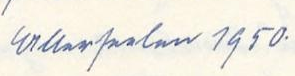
Allerseelen 1950
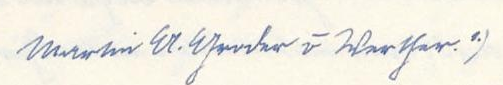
Martin A. Groder v/o Werther 1)
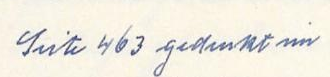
Seite 463 gedenkt im
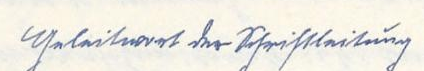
Geleitwort der Schriftleitung
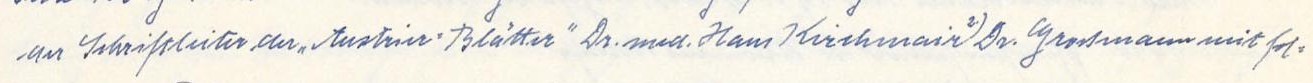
der Schriftleiter der „Austria-Blätter“ Dr. med. Hans Kirchmair 2) Dr. Großmann mit fol-
